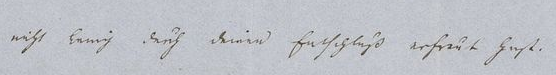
nicht wenig durch Deinen Entschluß erfreut hast.
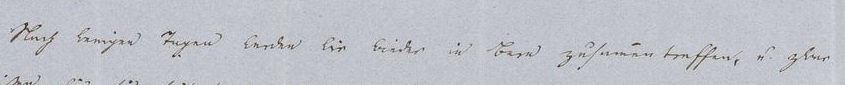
Nach wenigen Tagen werden wir wieder in Bern zusammentreffen, u. zwar
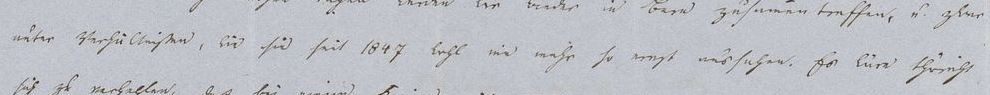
unter Verhältnissen, wie sie sich seit 1847 wohl nicht mehr so ernst aussahen. Es wäre thöricht
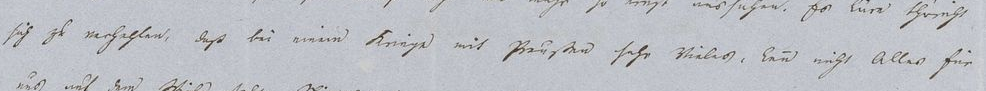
sich zu verhehlen, daß bei einem Kriege mit Preußen sehr Vieles, wenn nicht Alles für
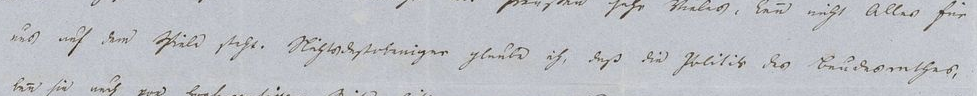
uns auf dem Spiele steht. Nichtsdestoweniger glaube ich, daß die Politik des Bundesrathes,
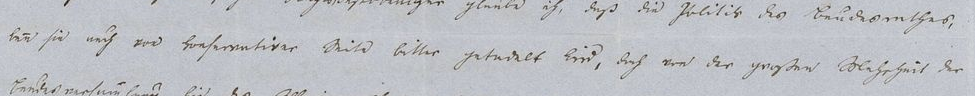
wenn sie auch von konservativer Seite bitter getadelt wird, doch von der großen Mehrheit der
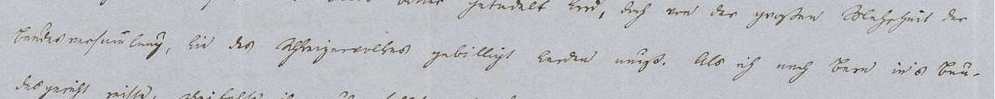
Bundesversammlung, wie des Schweizervolkes gebilligt werden muß. Als ich nach Bern in's Bun-
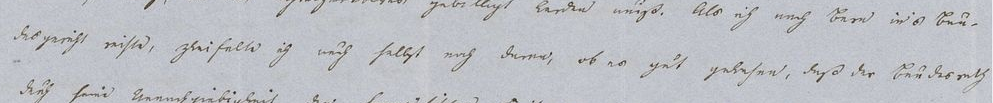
desgericht reiste, zweifelte ich auch selbst noch daran, ob es gut gewesen, daß der Bundesrath
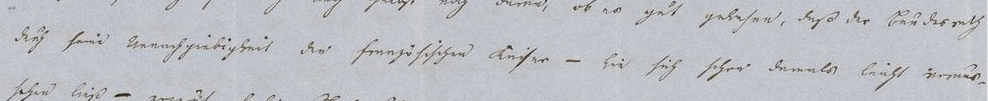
durch seine Unnachgiebigkeit den französischenKaiser – wie sich schon damals leicht voraus-
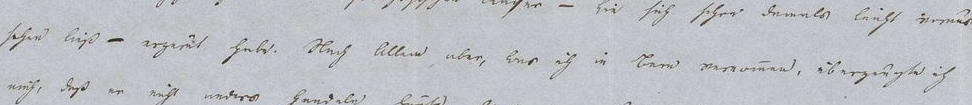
sehen ließ – erzürnt habe. Nach Allem aber, was ich in Bern vernommen, überzeugte ich
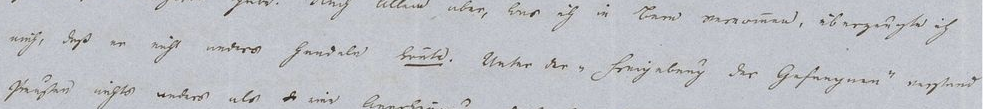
mich, daß er nicht anders handeln konnte. Unter der «Freigebung der Gefangnen» verstand
